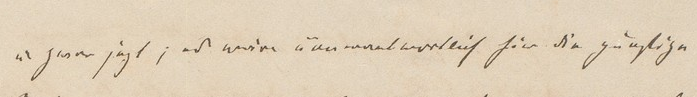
u zwar jezt; es wäre unverantwortlich hier die günstige
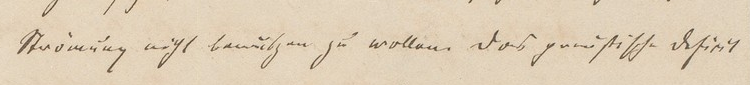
Strömung nicht benutzen zu wollen. Das preussische Deficit
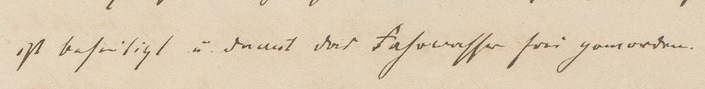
ist beseitigt u. daraus das Fahrwasser frei geworden.
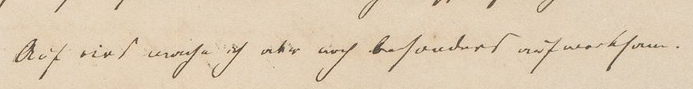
Auf eins mache ich aber noch besonders aufmerksam.
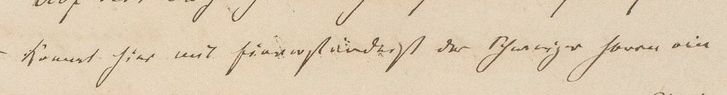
Kommt hier mit Einverständniß der Schweizer Herrn ein
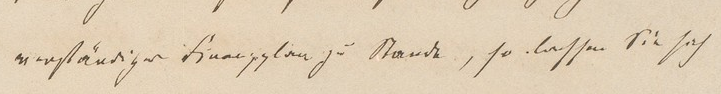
verständiger Finanzplan zu Stande, so lassen Sie sich
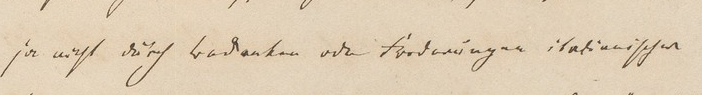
ja nicht durch Bedenken oder Forderungen italienischer
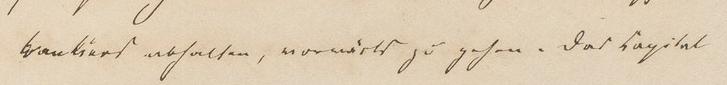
Bankiers abhalten, vorwärts zu gehen. Das Capital
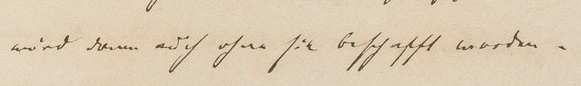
wird dann auch ohne sie beschafft werden. –
